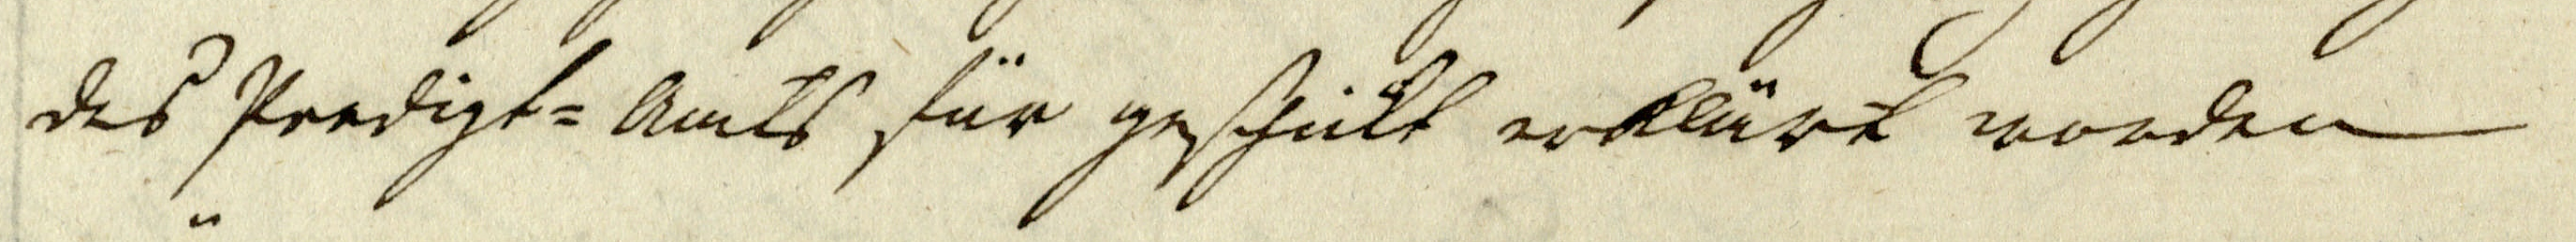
des Predigt- Amts für geschickt erklärt worden
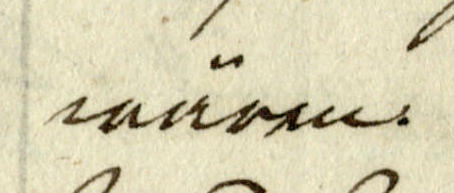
wären.
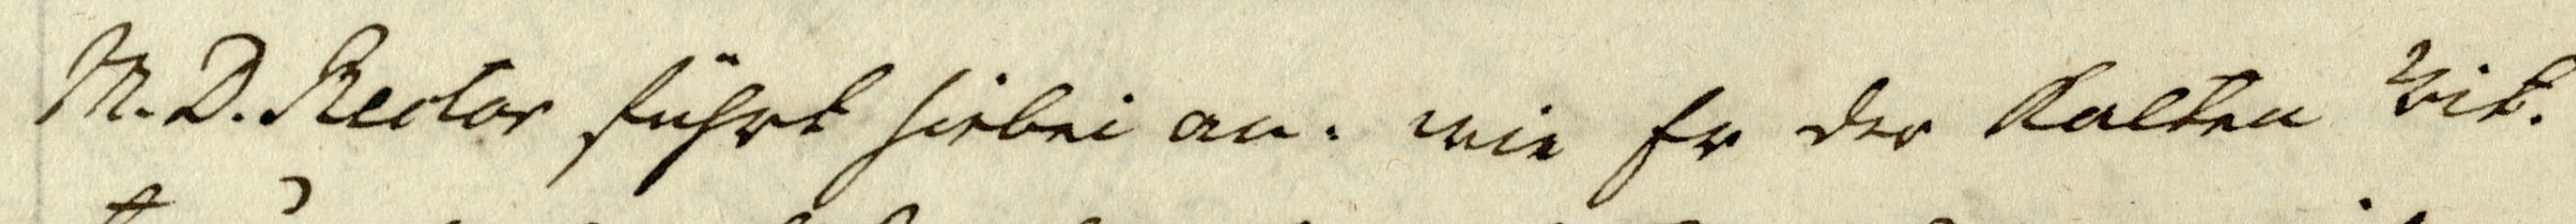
M. D. Rector führt hiebei an: wie Er der kalten Wit¬
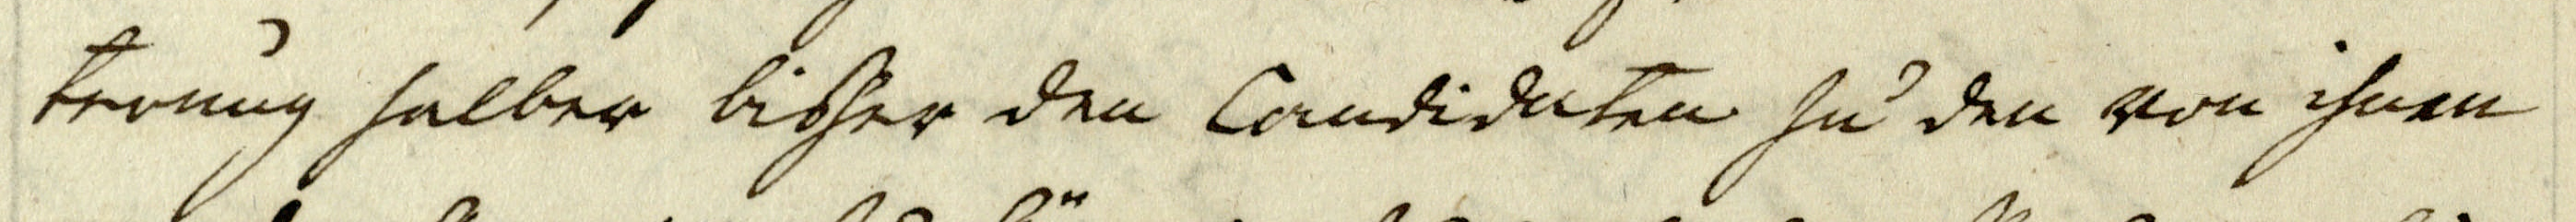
terung halber bisher den Candidaten zu den von ihnen
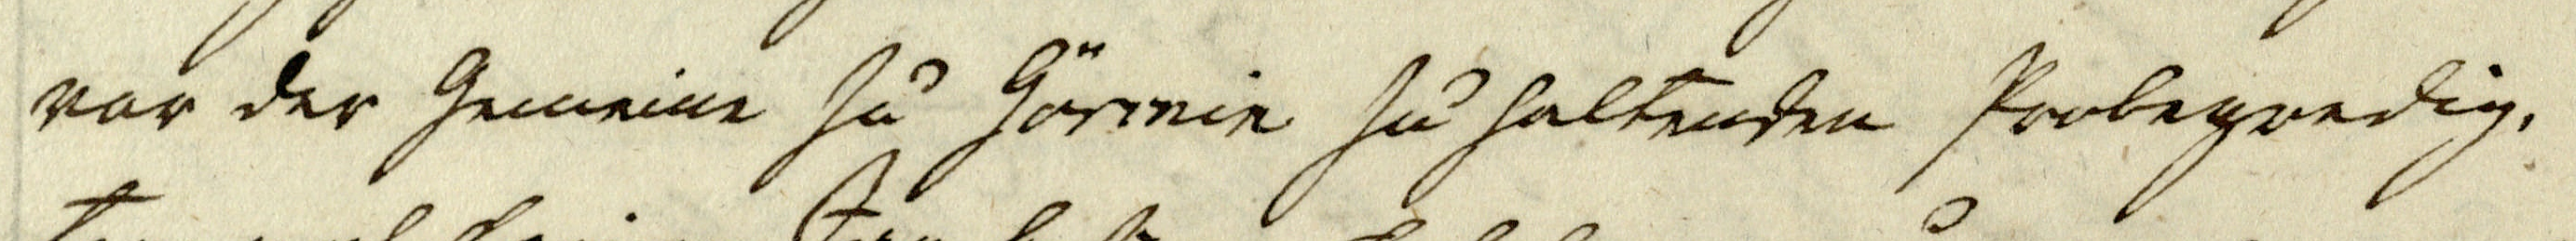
vor der Gemeine zu Görmin zu haltenden Probepredig¬
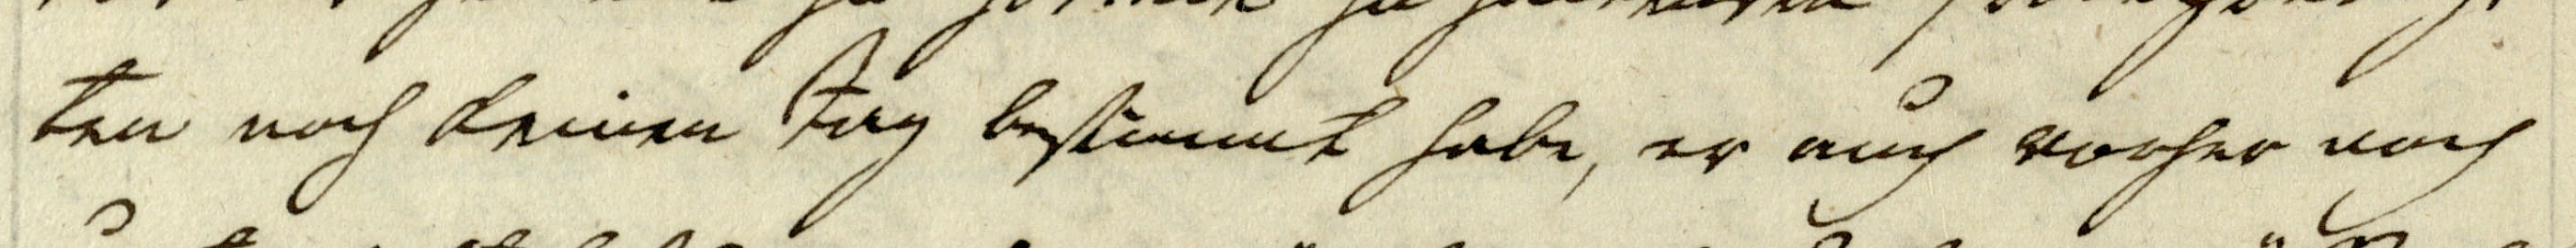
ten noch keinen Tag bestimmt habe, er auch vorher noch
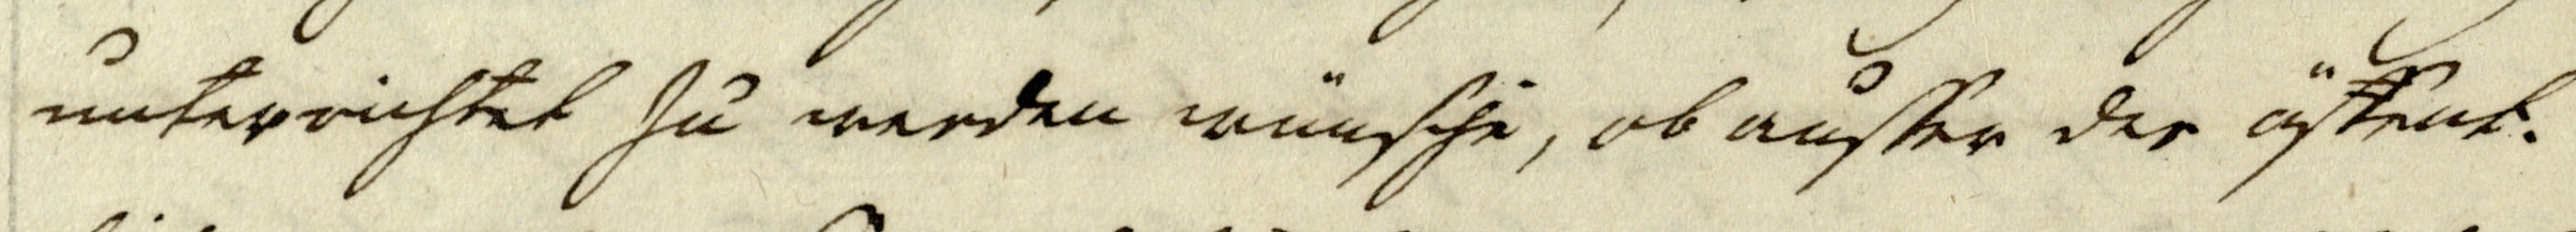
unterrichtet zu werden wünsche, ob ausser der öffent¬
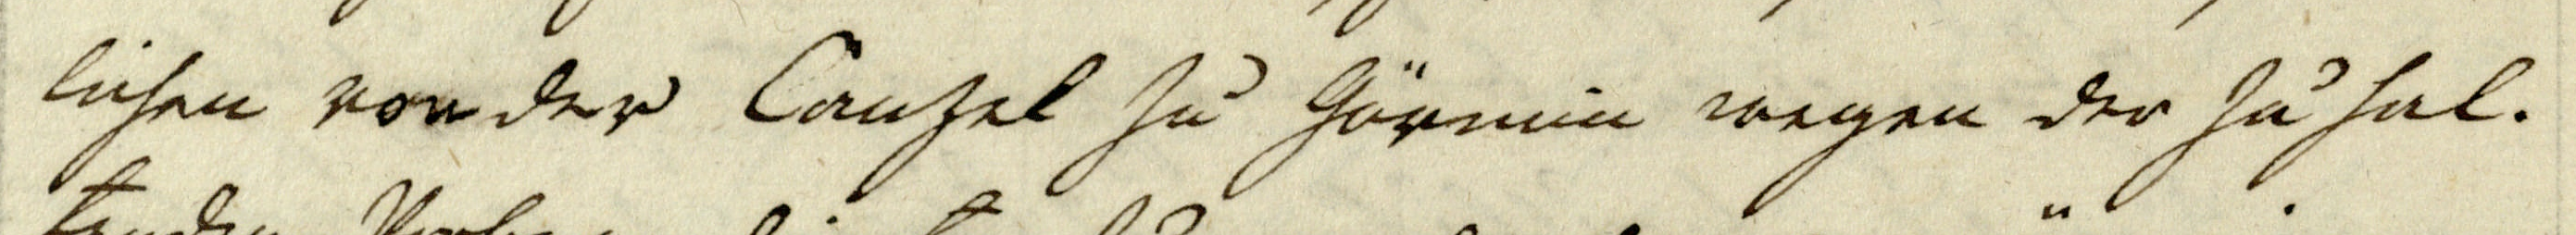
lichen von der Canzel zu Görmin wegen der zu hal¬
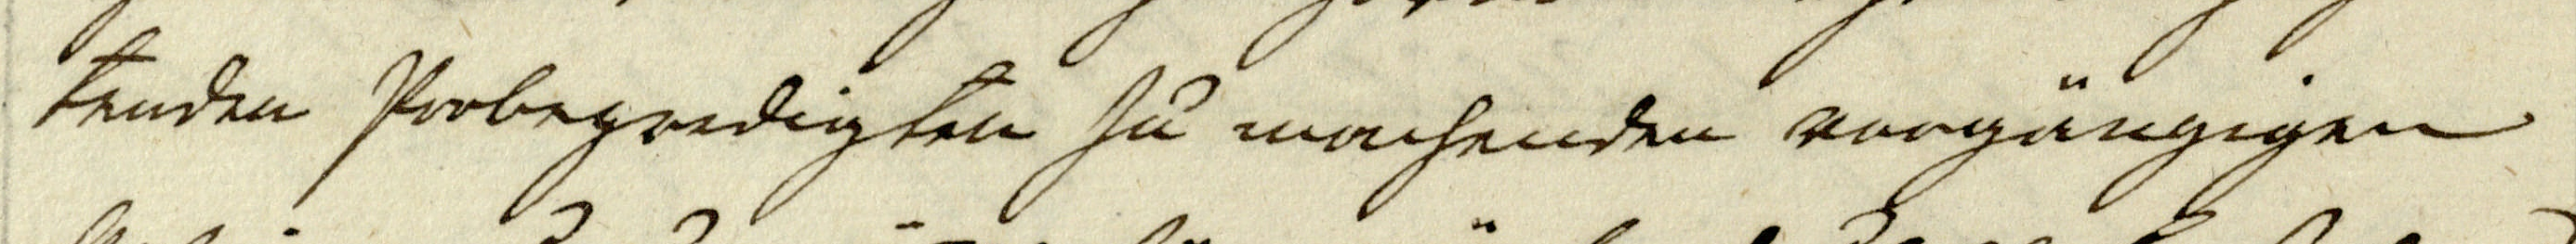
tenden Probepredigten zu machenden vorgängigen
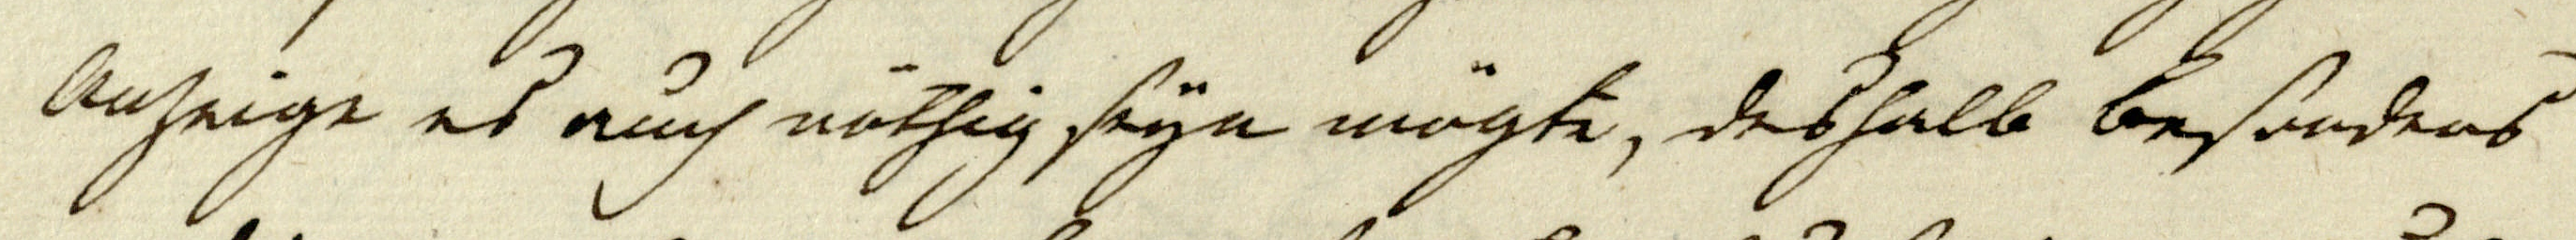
Anzeige es auch nöthig seÿn mögte, deshalb besonders
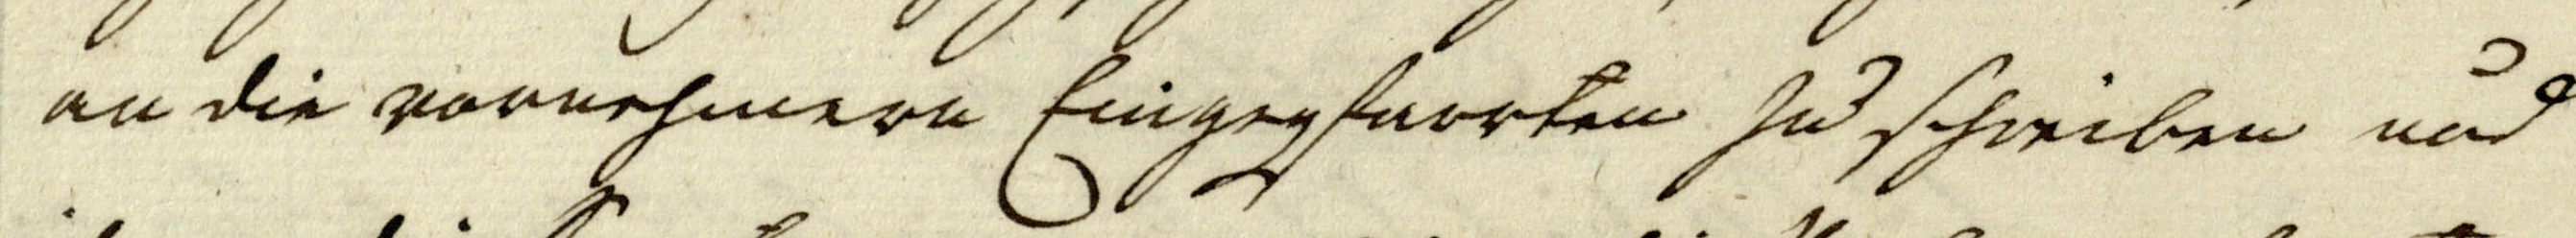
an die vornehmern Eingepfarrten zu schreiben und
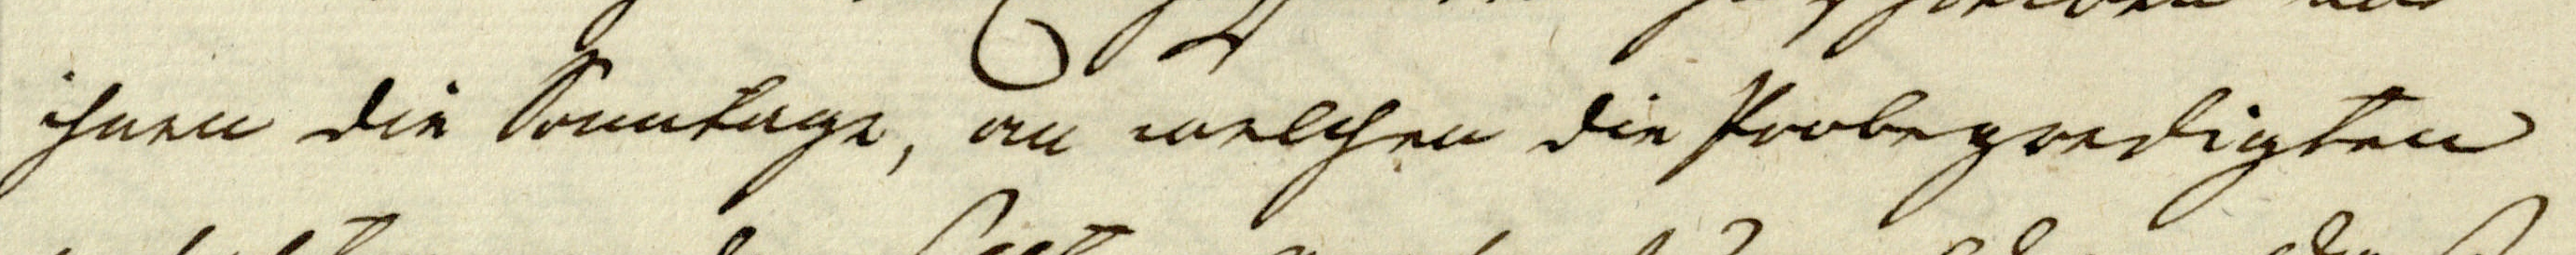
ihnen die Sonntage, an welchen die Probegredigten
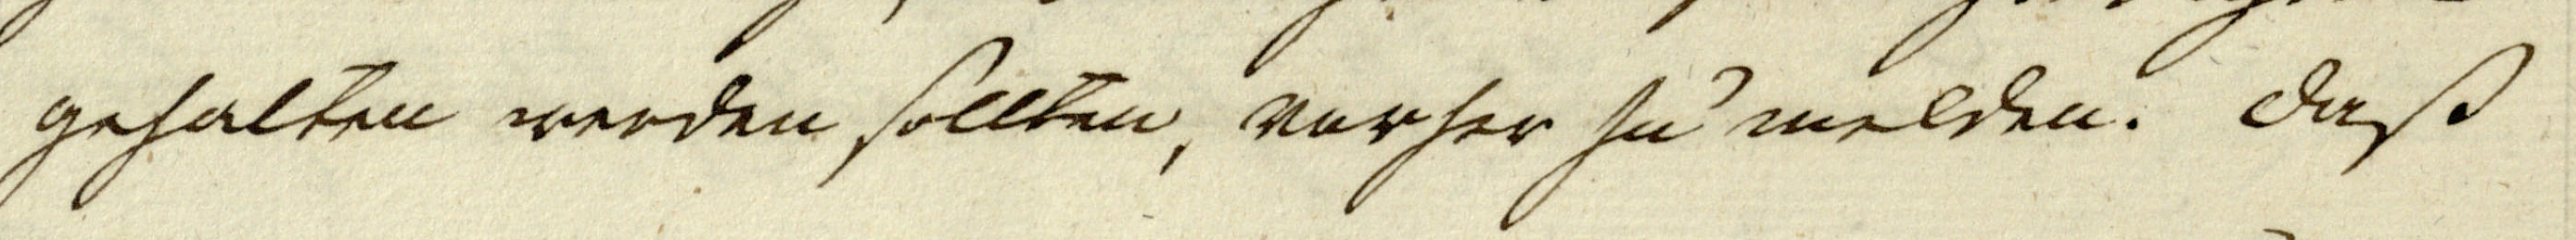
gehalten werden sollten, vorher zu melden. Daß
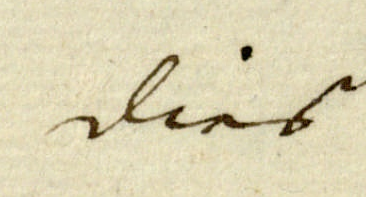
dies
